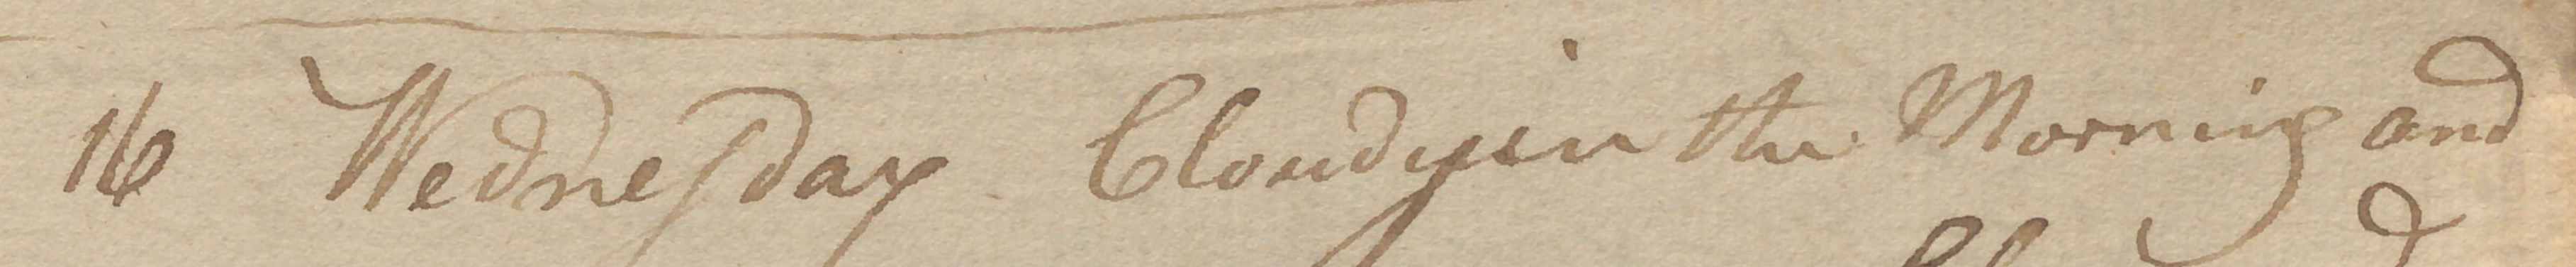16 Wednesday Cloudy in the Morning and
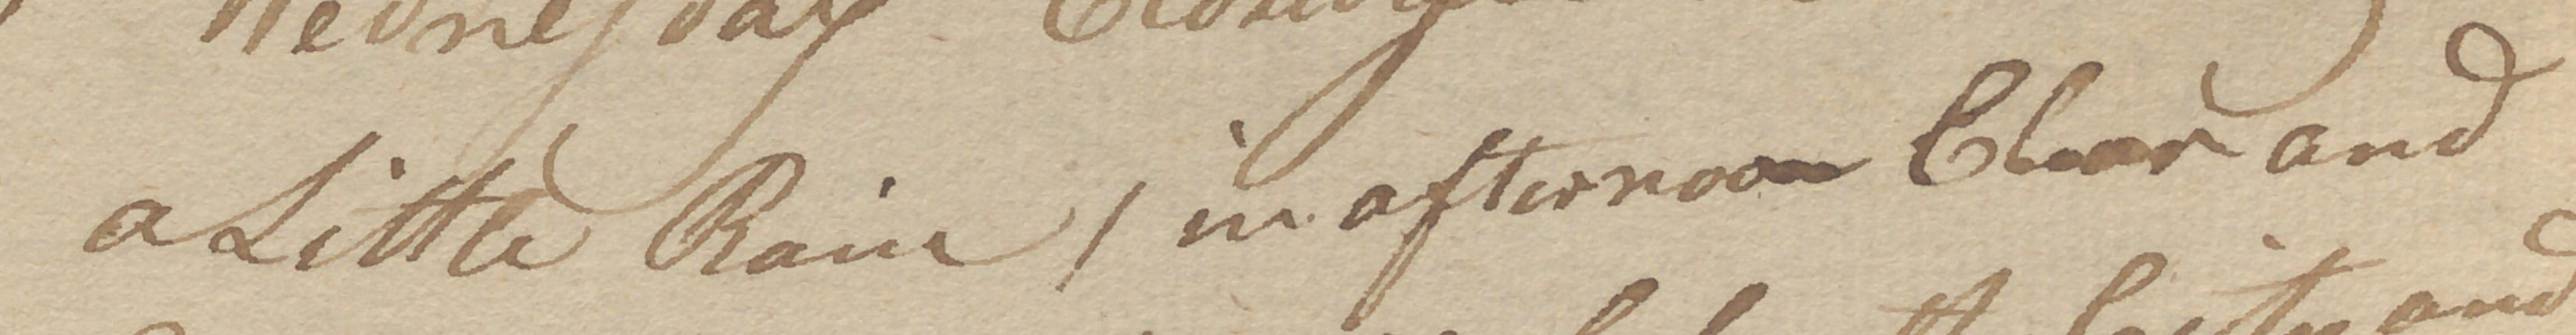a Little Rain / in afternoon Clear and
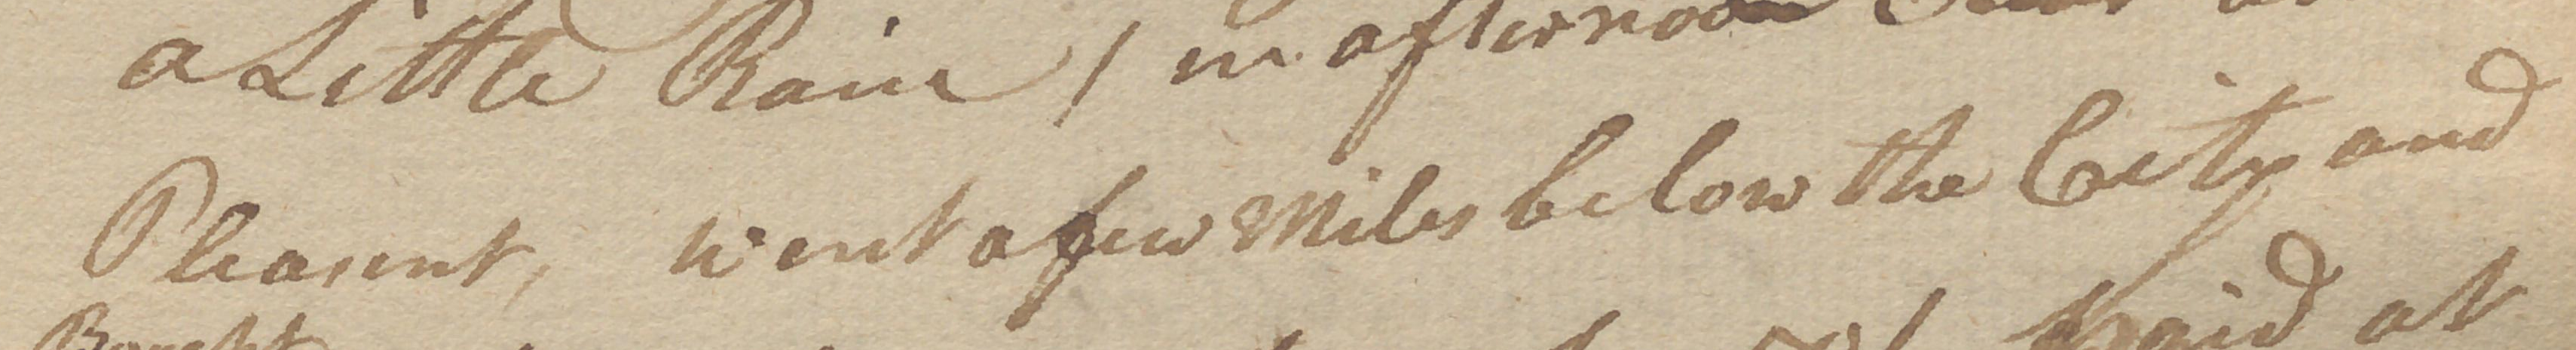Pleasent, went a few Miles below the City and
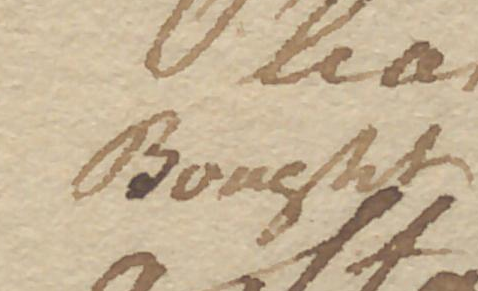Bought
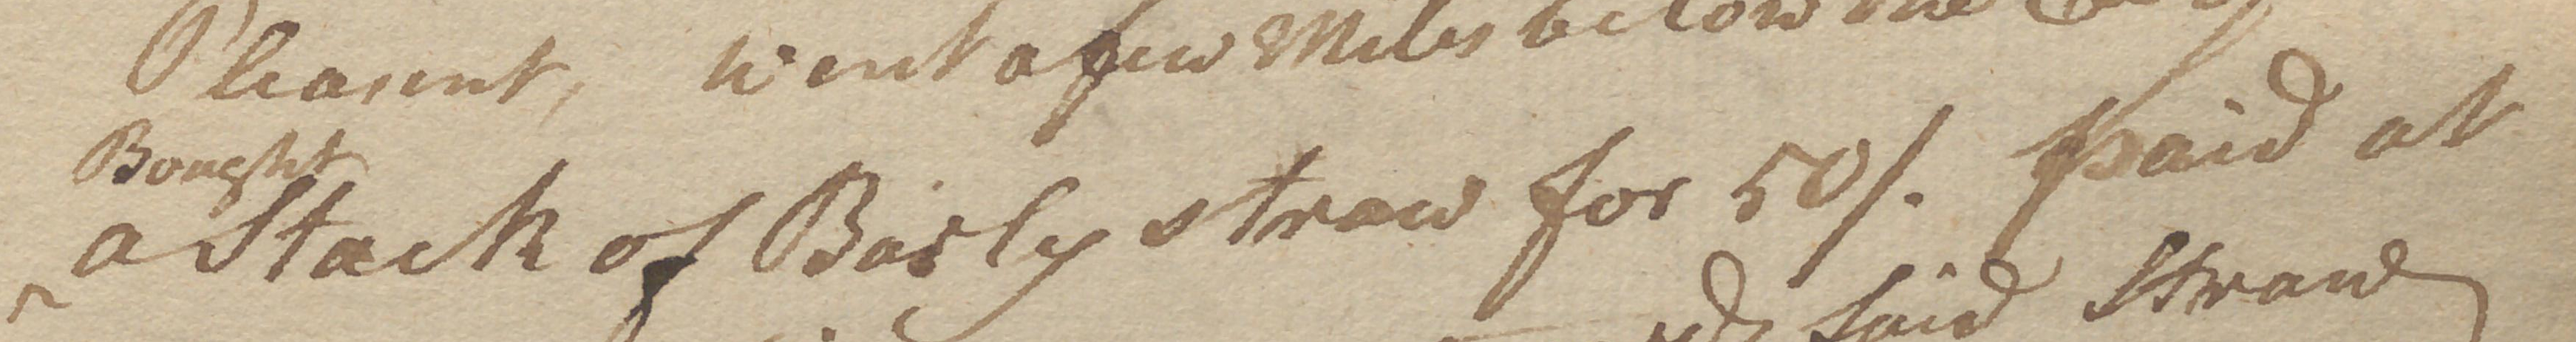^ a Stack of Barly straw for 50s. paid at
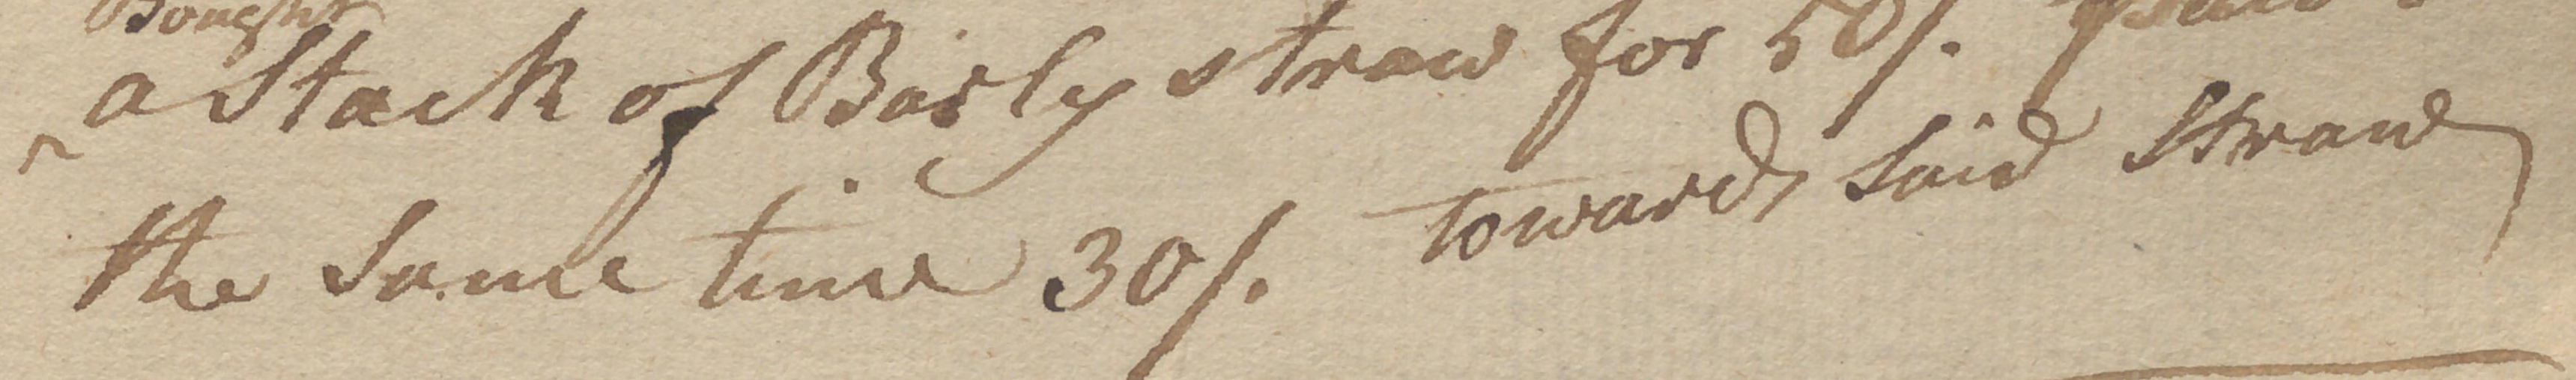the same time 30s. towards said Straw
